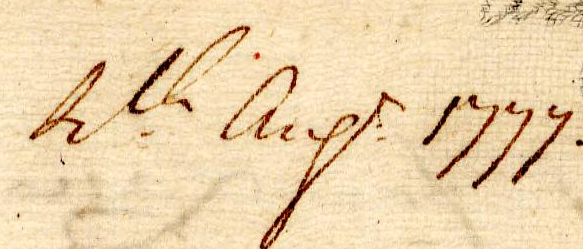4^th. Aug^t. 1777.
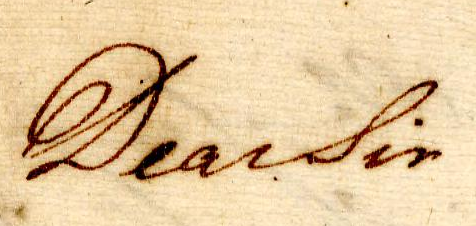Dear Sir
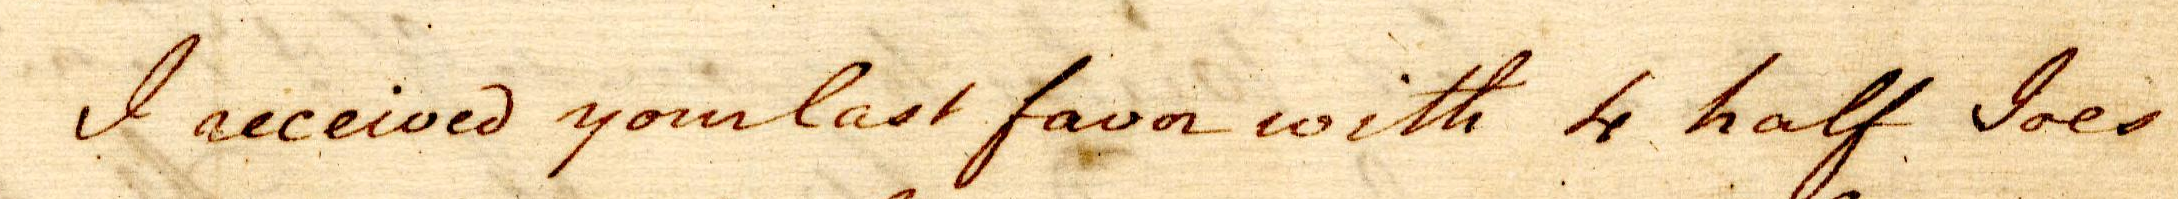I received your last favor with 4 half Joes
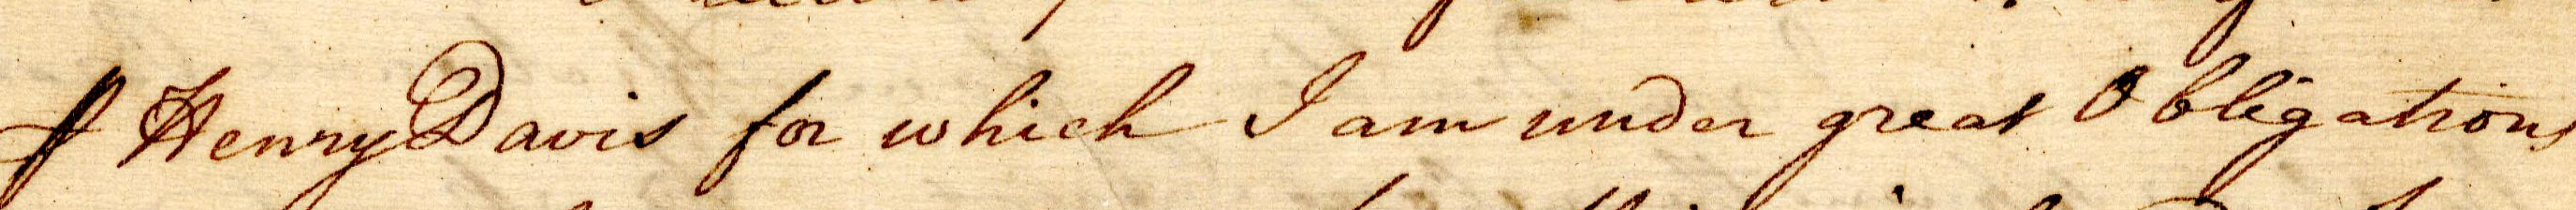& Henry Davis for which I am under great Obligations
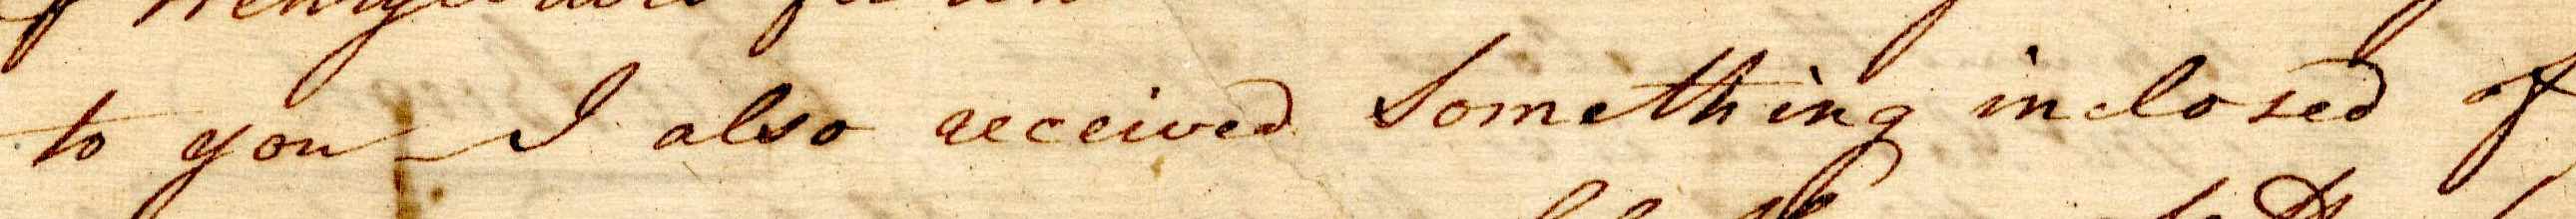to you. I also received Something inclosed of
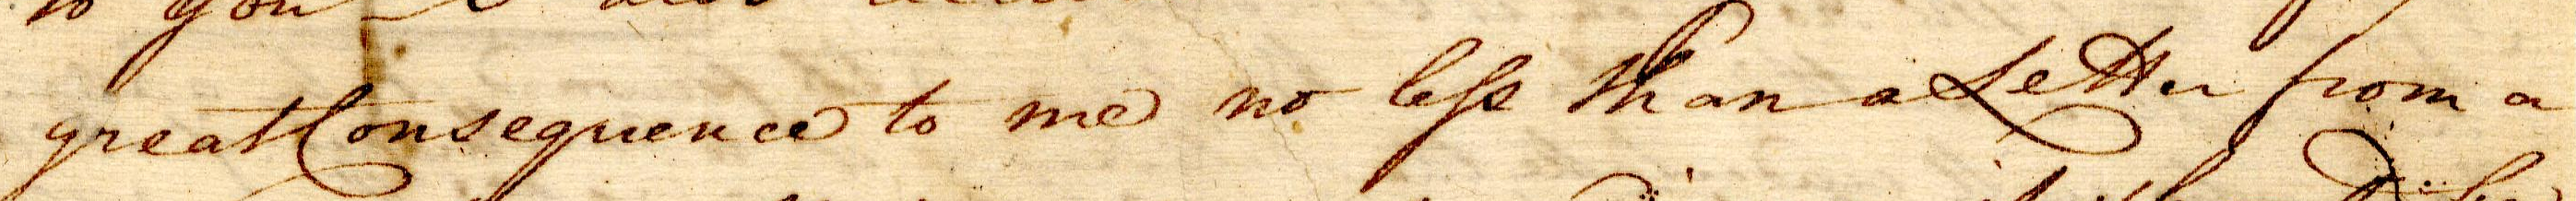great Consequence to me no less than a Letter from a
